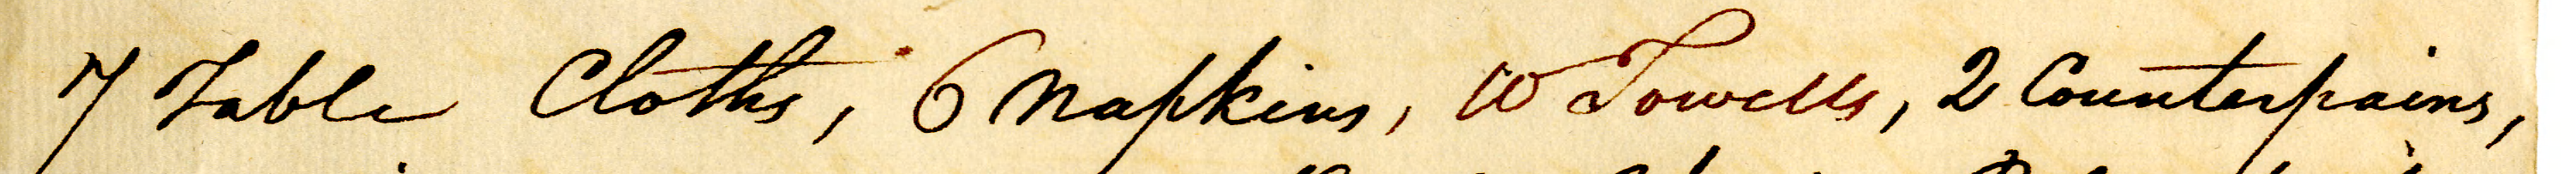7 Table Clothes, 6 napkins, 10 Towells, 2 Counterpains,
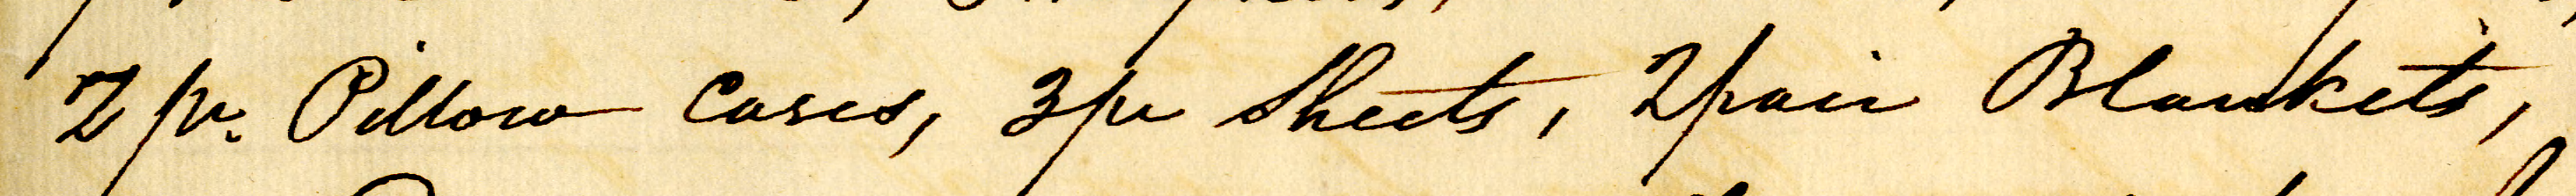2 pc. Pillow cases, 3 pc sheets, 2 pair Blankets,
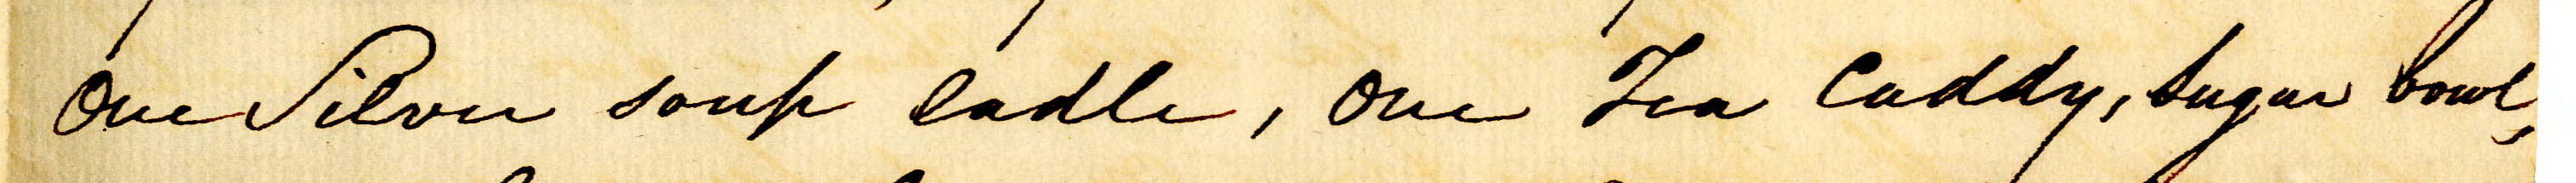one Silver soup ladle, one Tea caddy, sugar bowl,
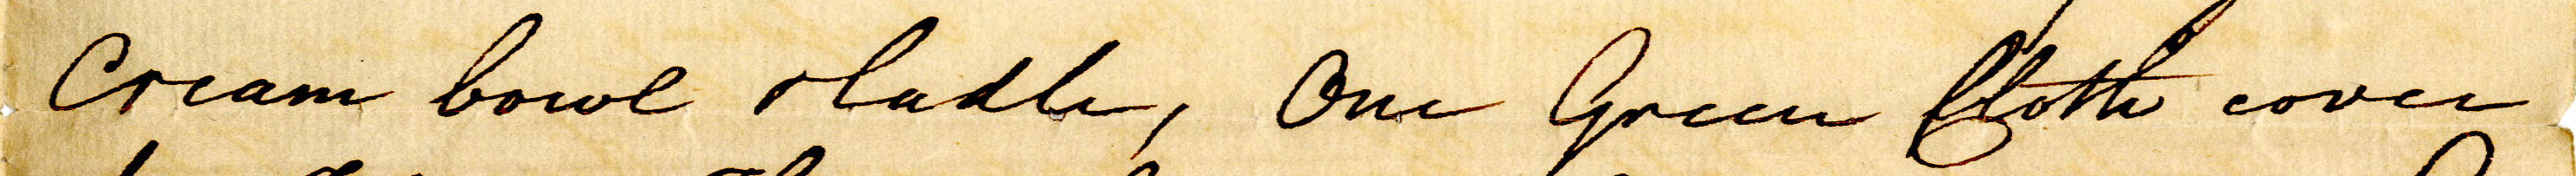cream bowl & ladle, one Green Cloth cover
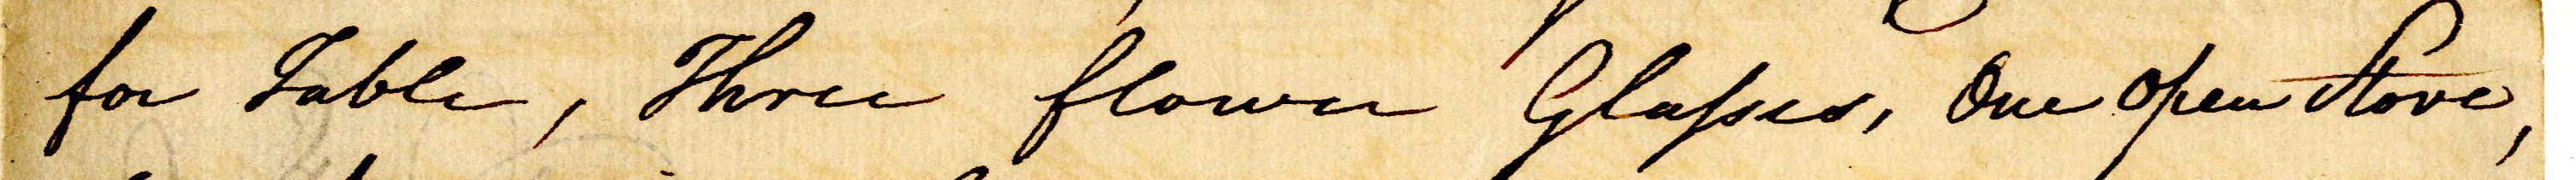for Table, Three flower Glasses, one open Stove,
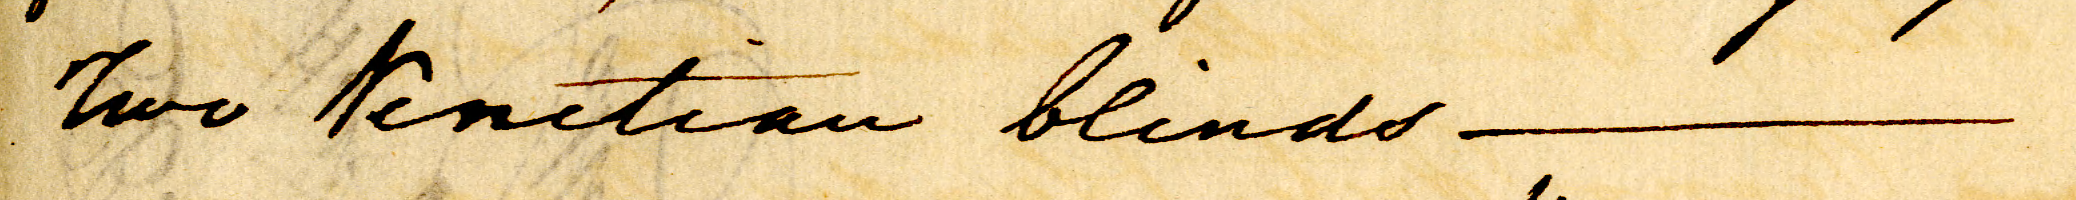Two Venetian blinds-
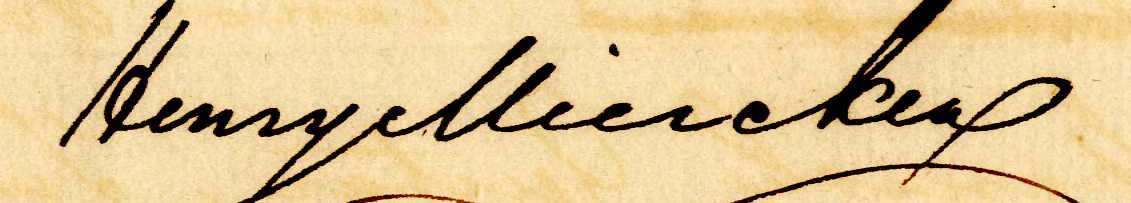Henry Miercken
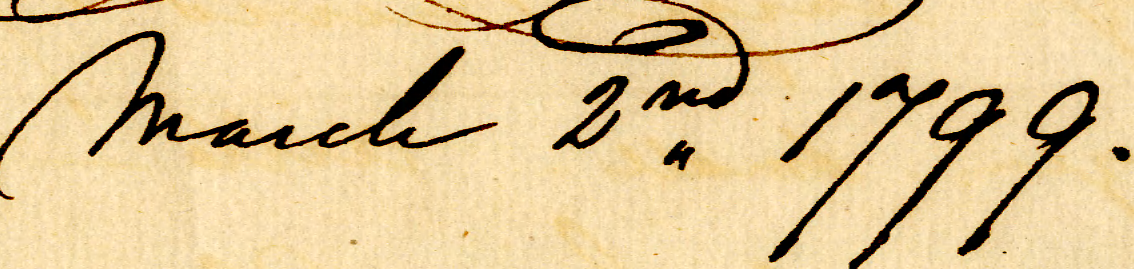March 2^nd. 1779.
